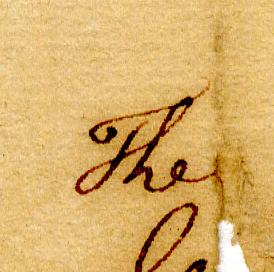The
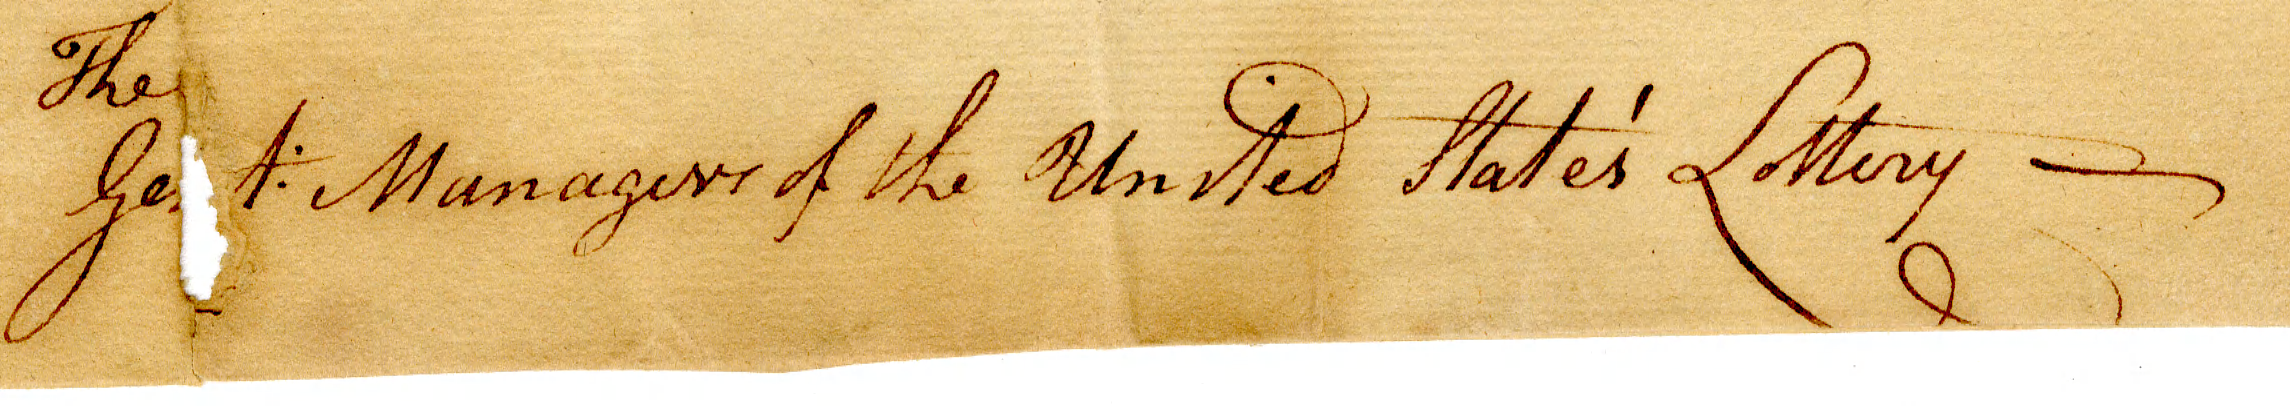Ge t: Managers of the United States' Lottery-
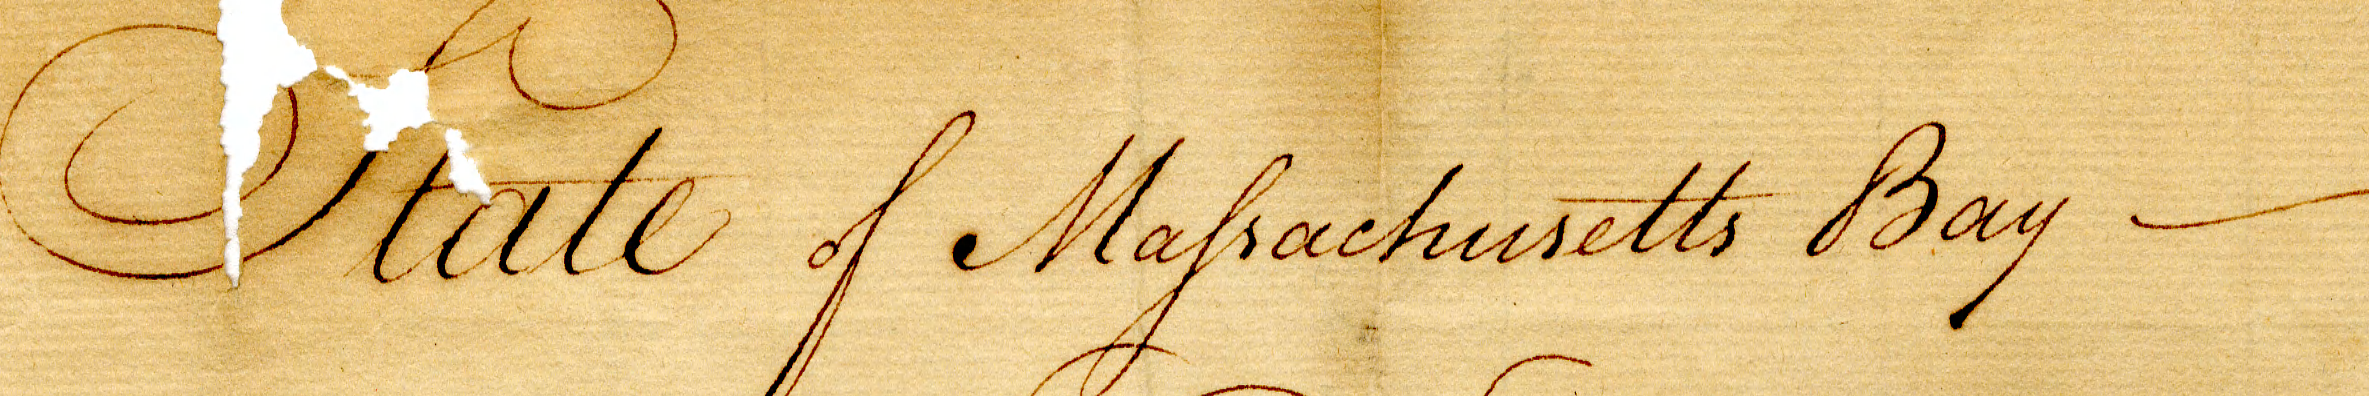State of Massachusetts Bay
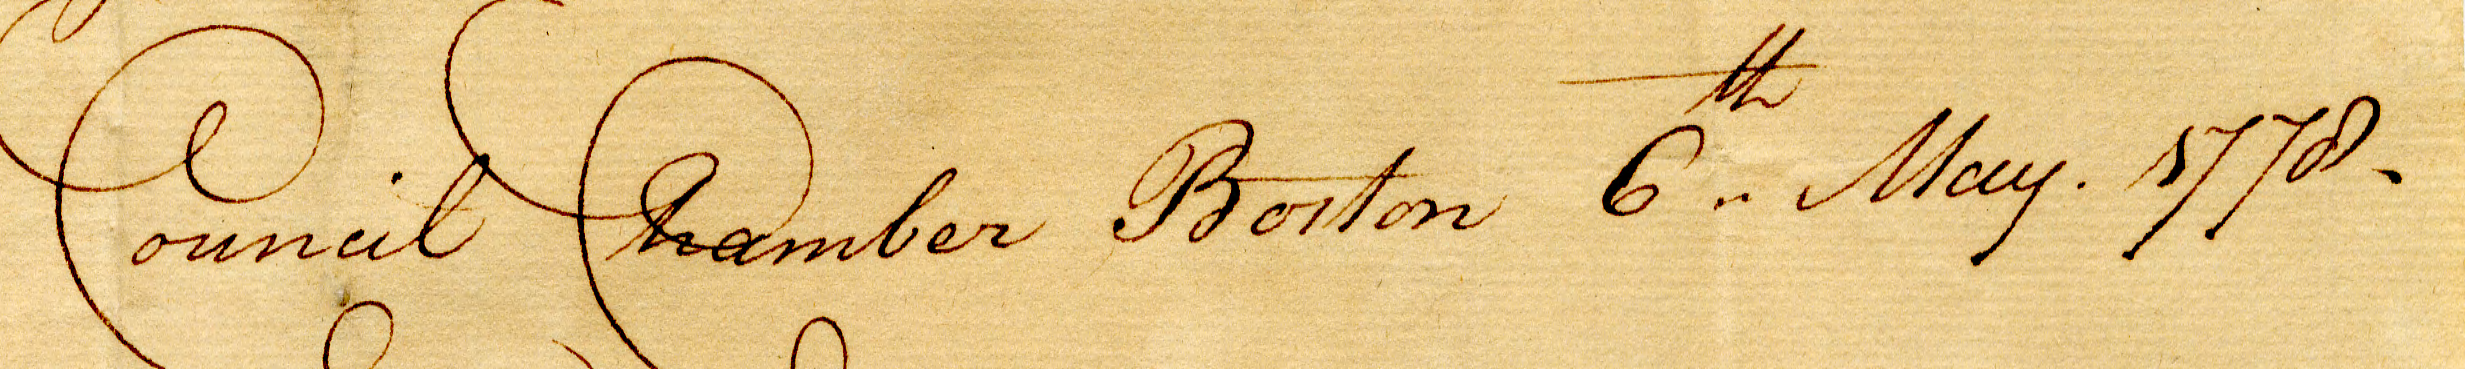Council Chamber Boston 6^th. May. 1778.
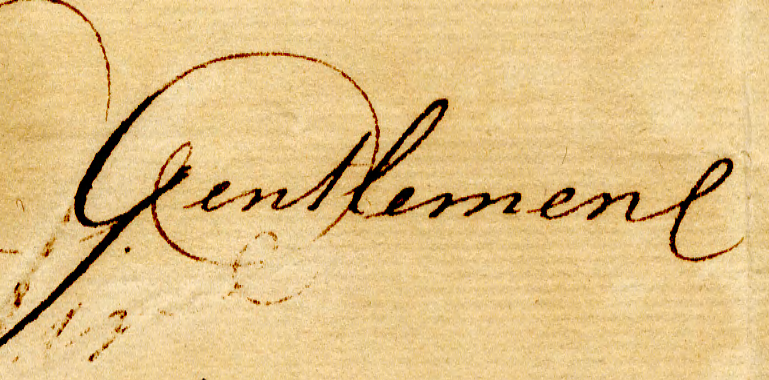Gentlemen
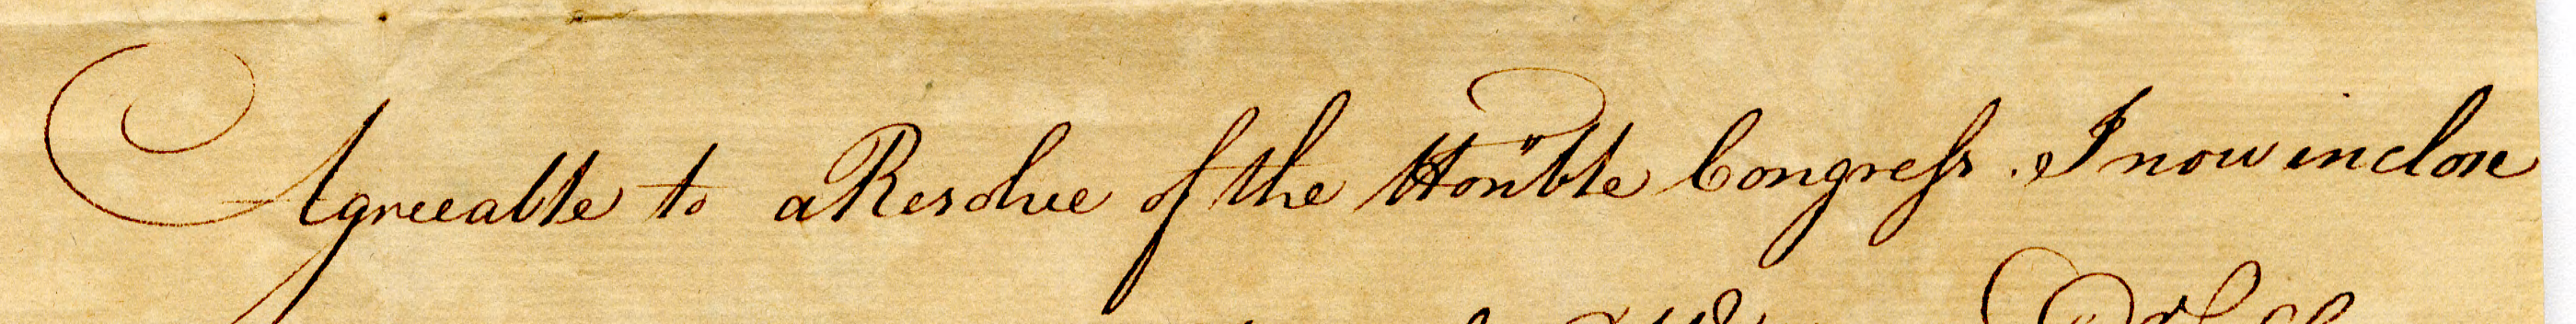Agreeable to a Resolve of the Honble Congress I now inclose
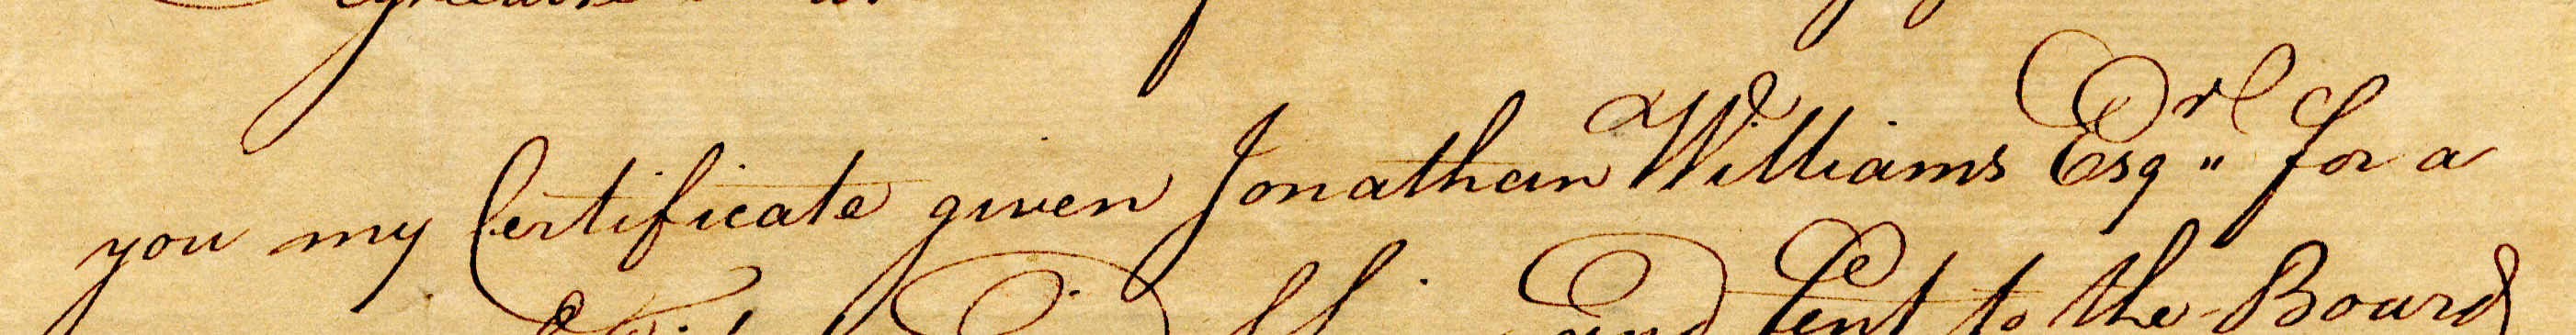you my Certificate given Jonathan Williams Esq^r. for a
